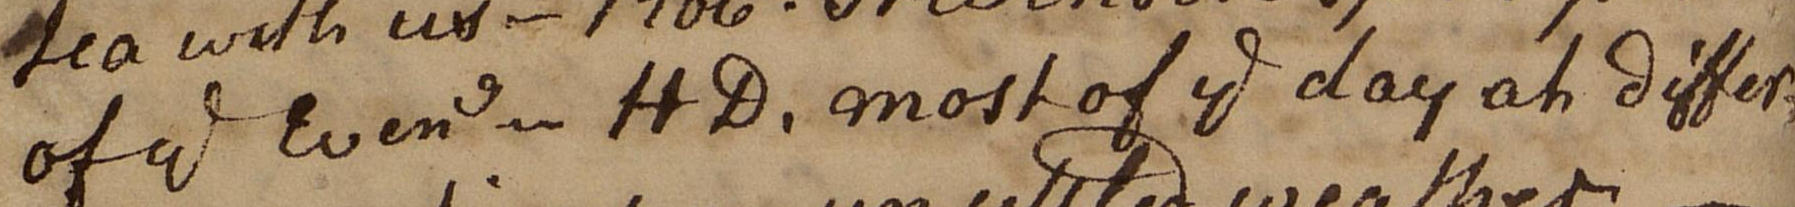of y^e Even^g- HD. most of y^e day at differ
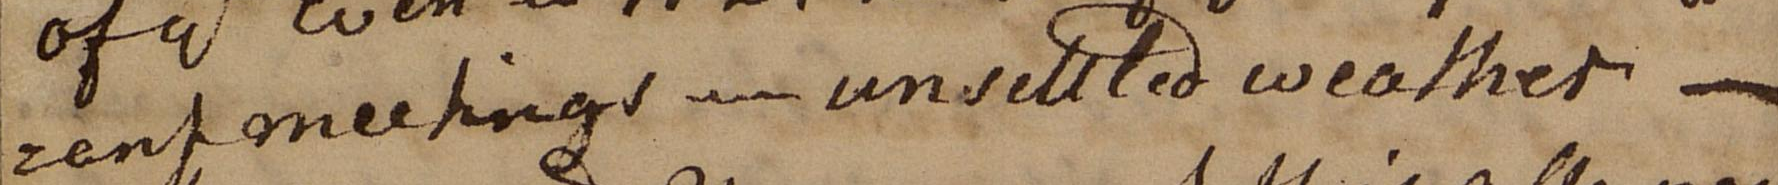-ent meetings- unsettled weather-
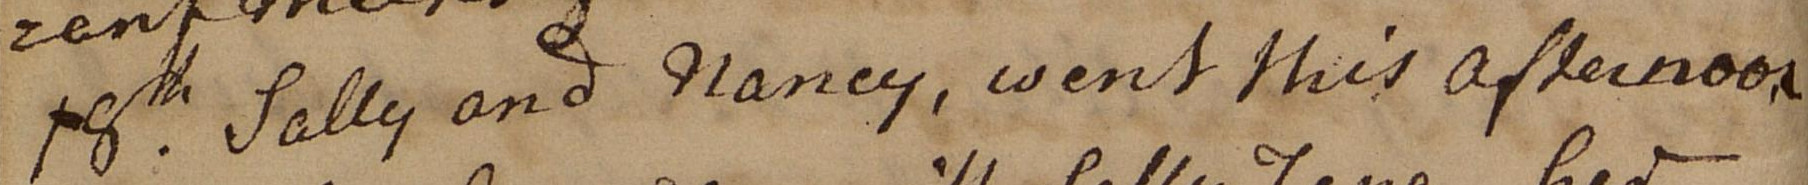18^th. Sally and Nancy, went this afternoon
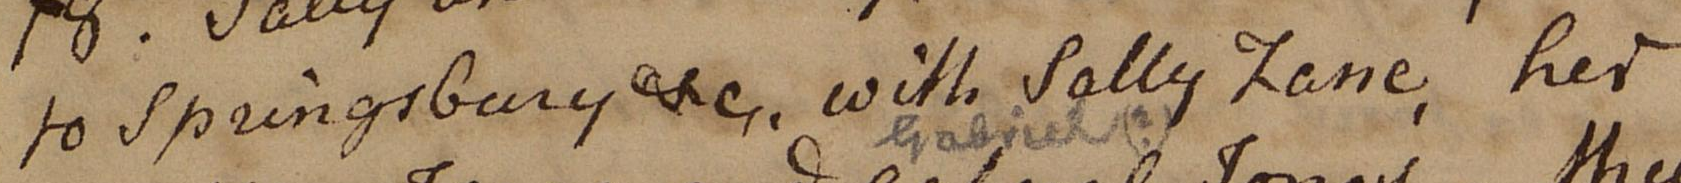to Springsbury &c, with Sally Zane, her
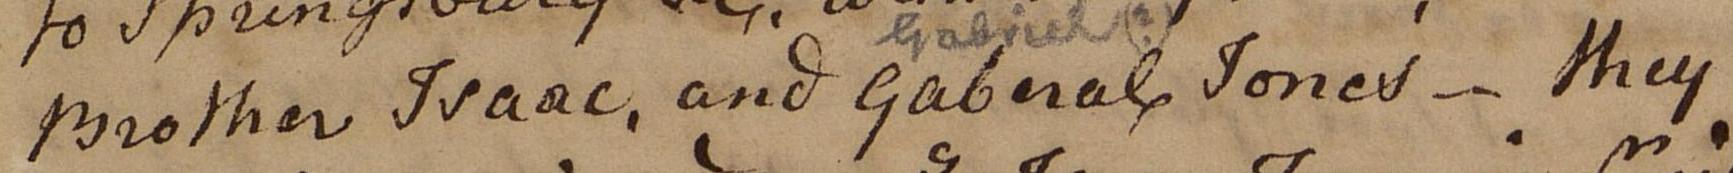Brother Isaac, and Gaberal Jones- they
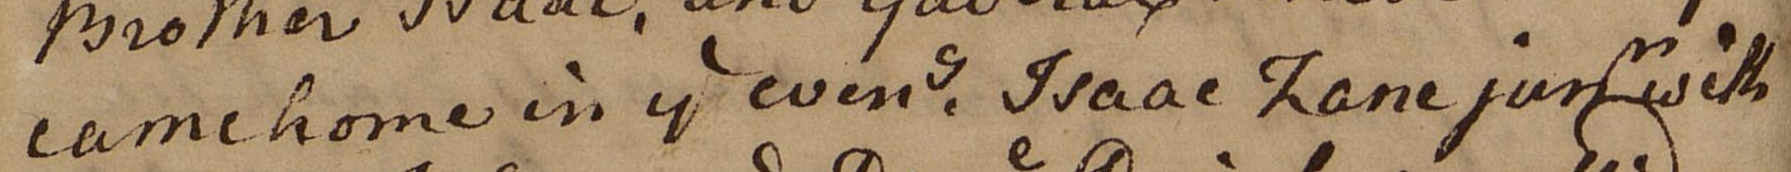came home in y^e even^g. Isaac Zane jun^r. with
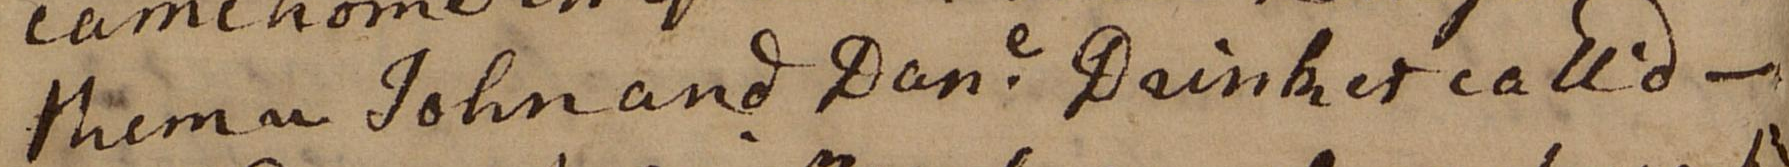them- John and Dan^l Drinker call'd-
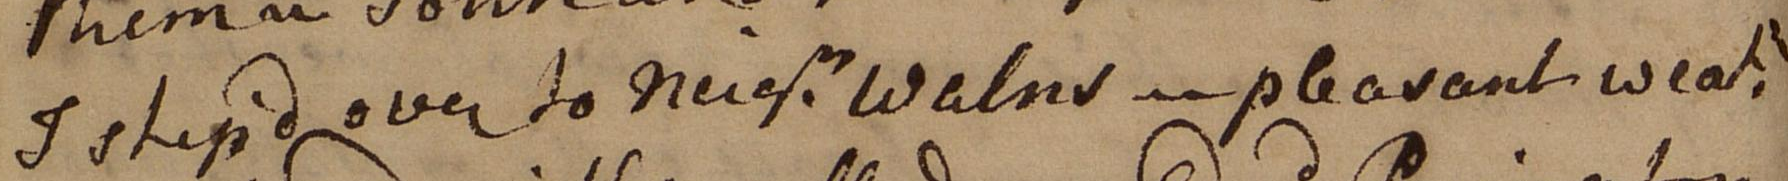I step'd over to Neig^r. Walns- pleasant wea^tr.
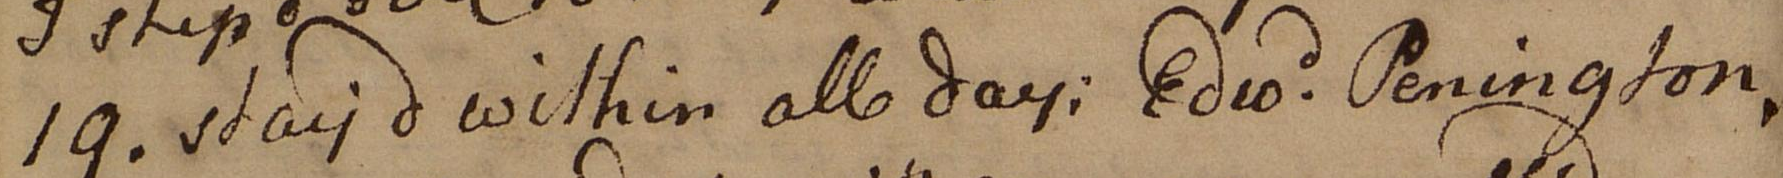19. stay d within all day: Edw^d. Penington,
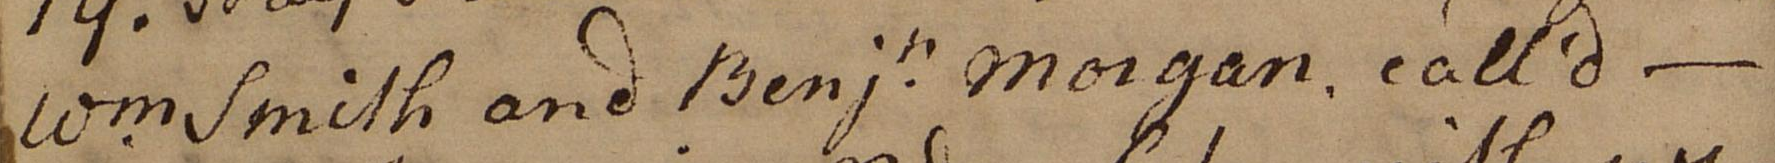W^m. Smith and Benj^n. Morgan, call'd-
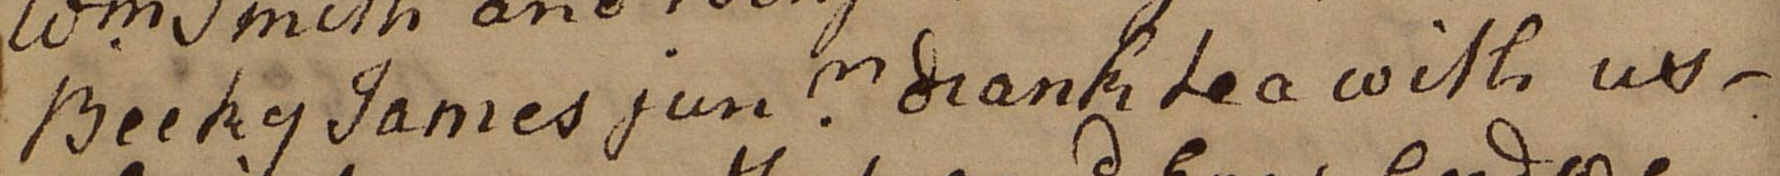Becky James jun^r. drank tea with us-
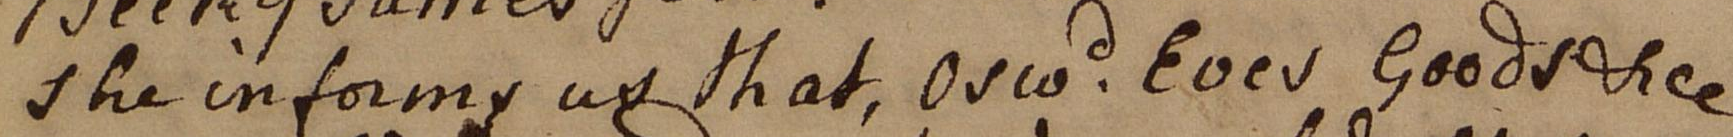she informs us that, Osw^d Eves Goods &c
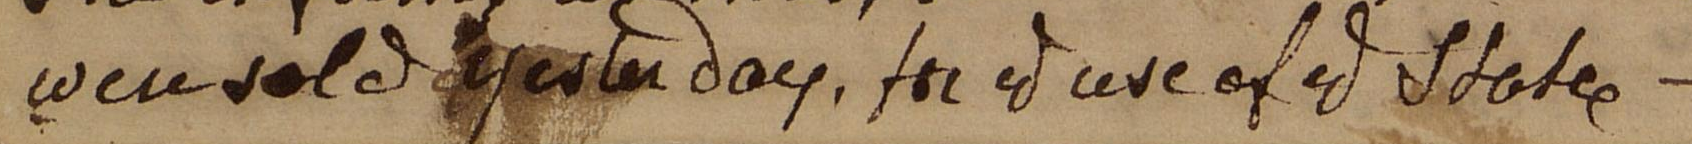were sold yesterday, for y^e use of y^e State-
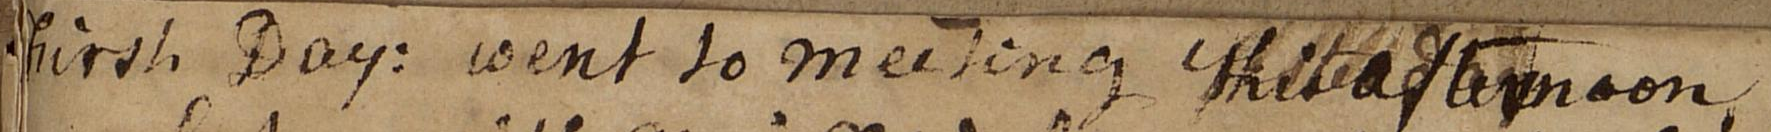First Day: went to meeting this afternoon,
